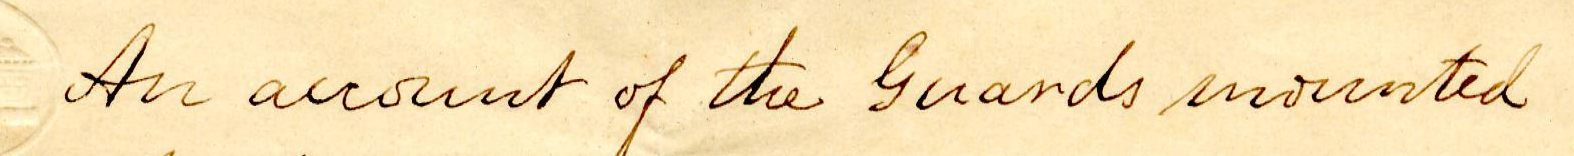An account of the Guards mounted
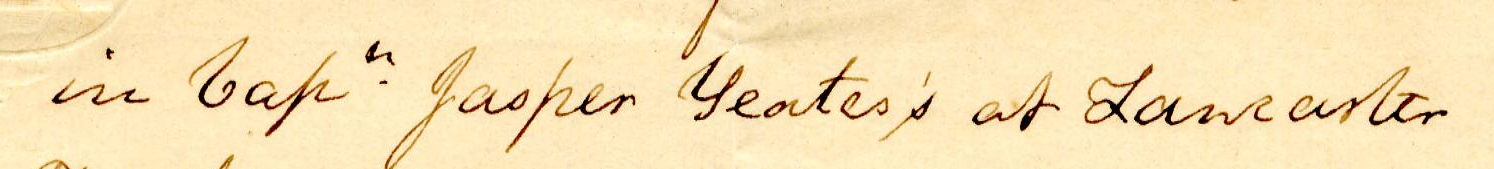in Cap^n. Jasper Yeates's at Lancaster
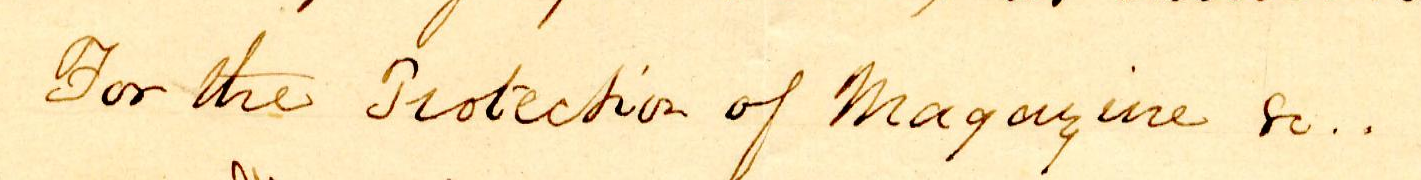For the Protection of Magazine &c..
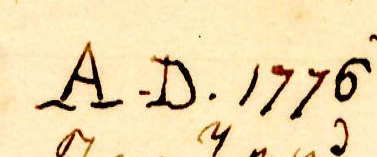A. D. 1776
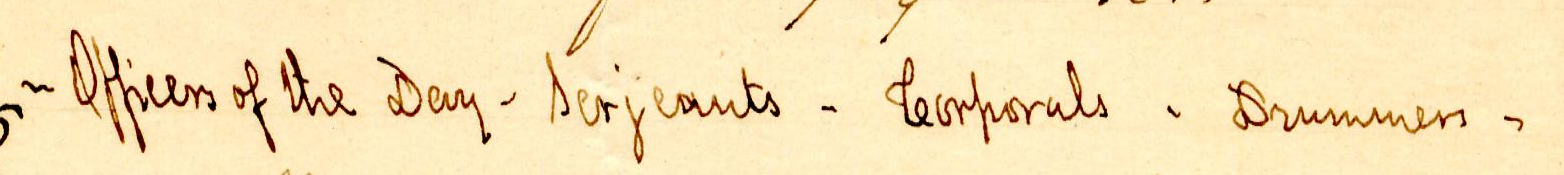Officers of the Day- Serjeants- Corporals- Drummers-
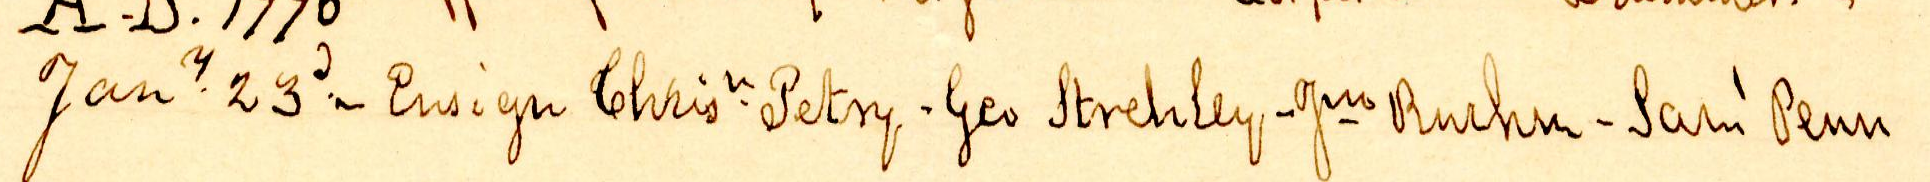Jan^y. 23^d- Ensign Chris^r. Petry- Geo Strehley- J^as Ruckie- Sam^l Penn
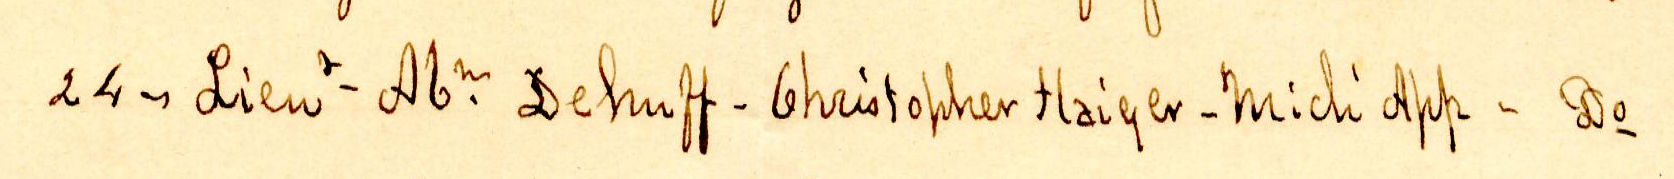24- Lieu^t- Al^m. Dehuff- Christopher Haiger - Mich^l App- D^o
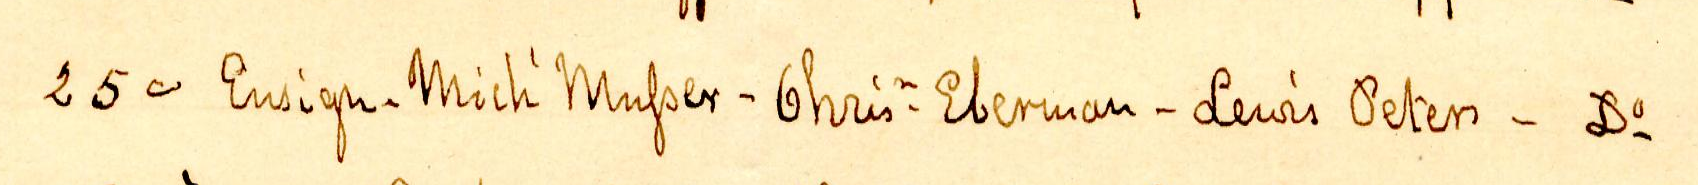25- Ensign- Mich^l Musser- Chris^r. Eberman- Lewis Peter- D^o
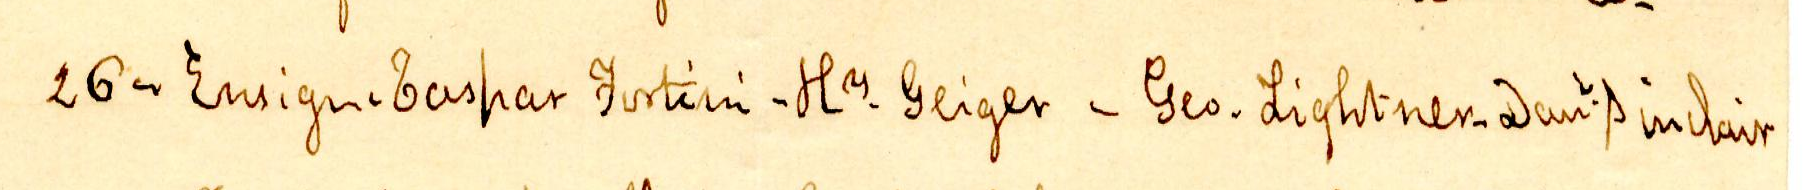26- Ensign Caspar Fortini- H^m Geiger- Geo. Lightiner- Dan^l. Sinclair
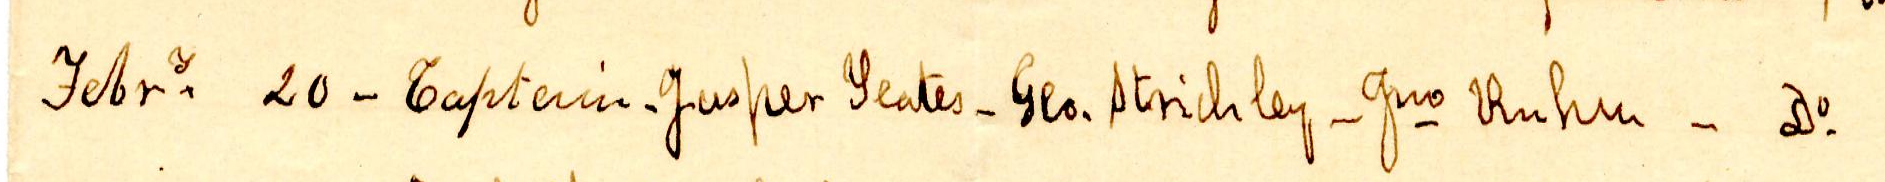Febr^y. 20- Captain Jasper Yeates- Geo. Strickley- J^no Ruhan - D^o.
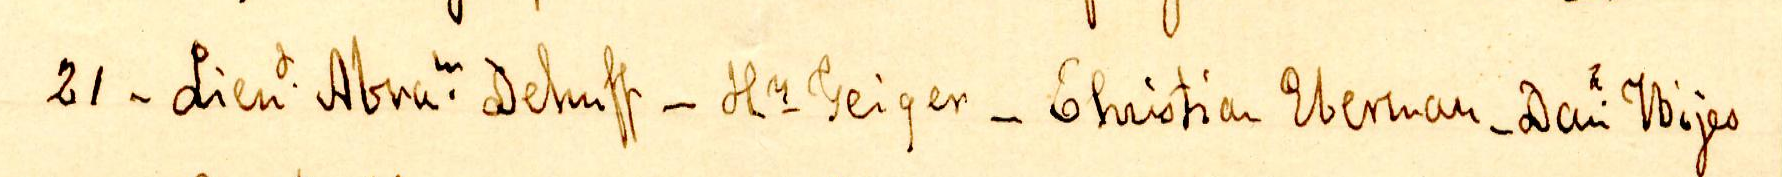21- Lieu^t Abra^m. Dehuff- H^m Geiger- Christian Uerman Dan^l. Voijes
